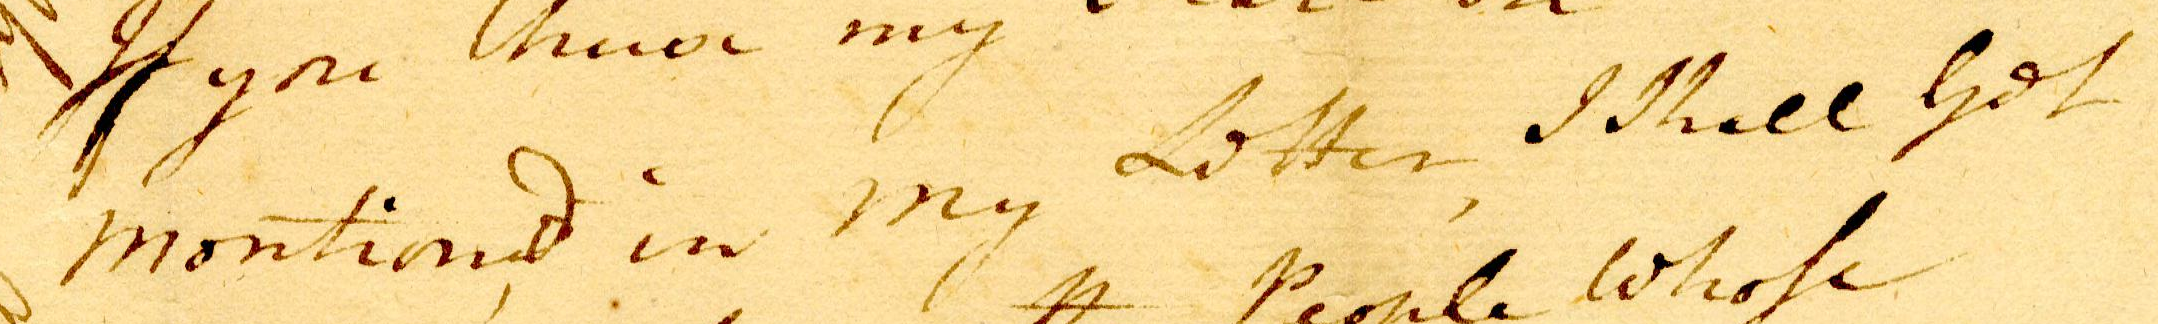mentioned in my Letter, I shall Get
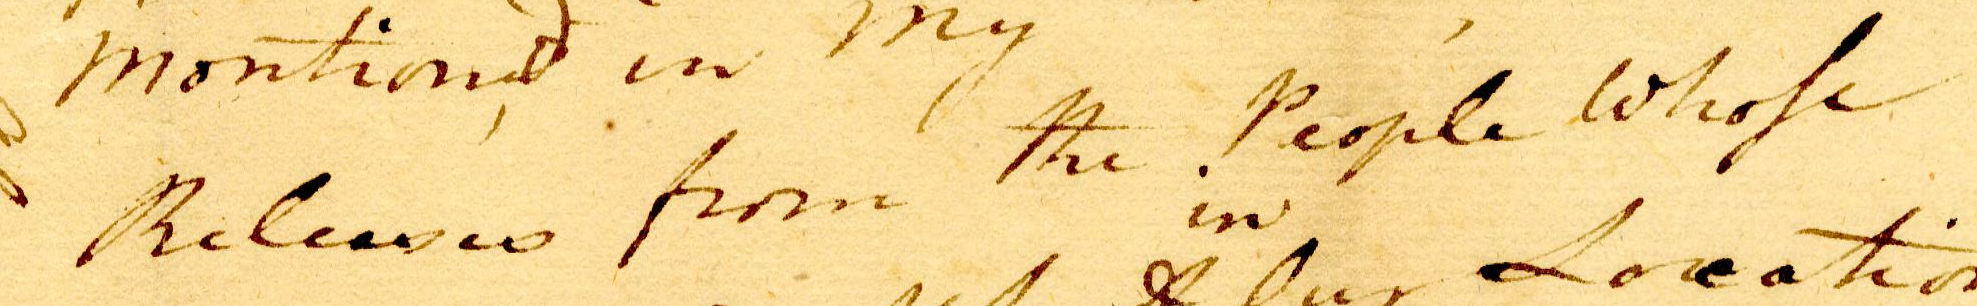Releases from the People whose
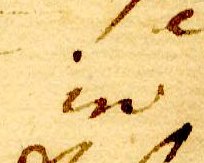in
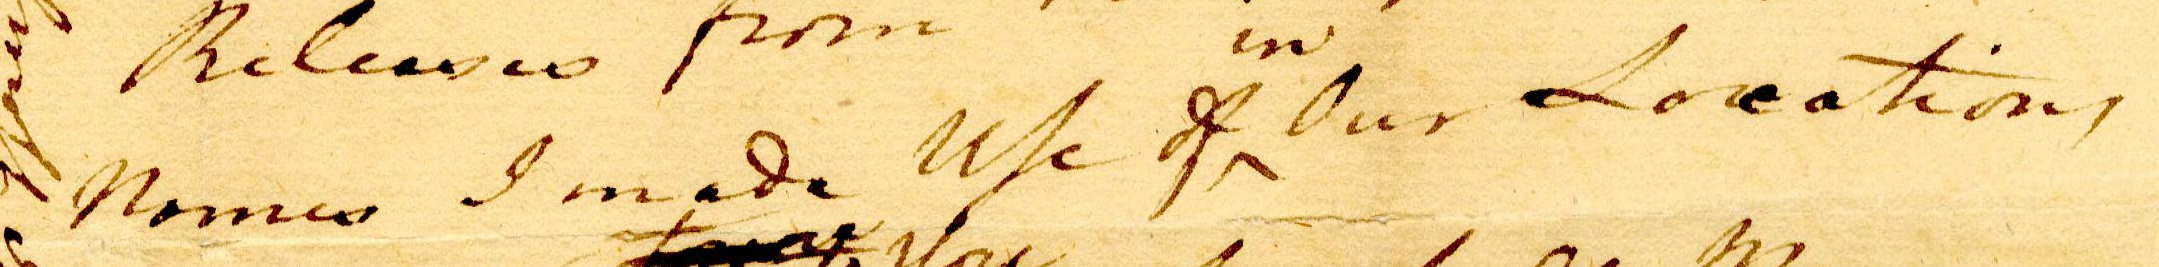Names I made Use of ^ Our Locations
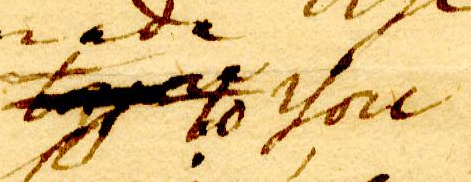[_____] to you
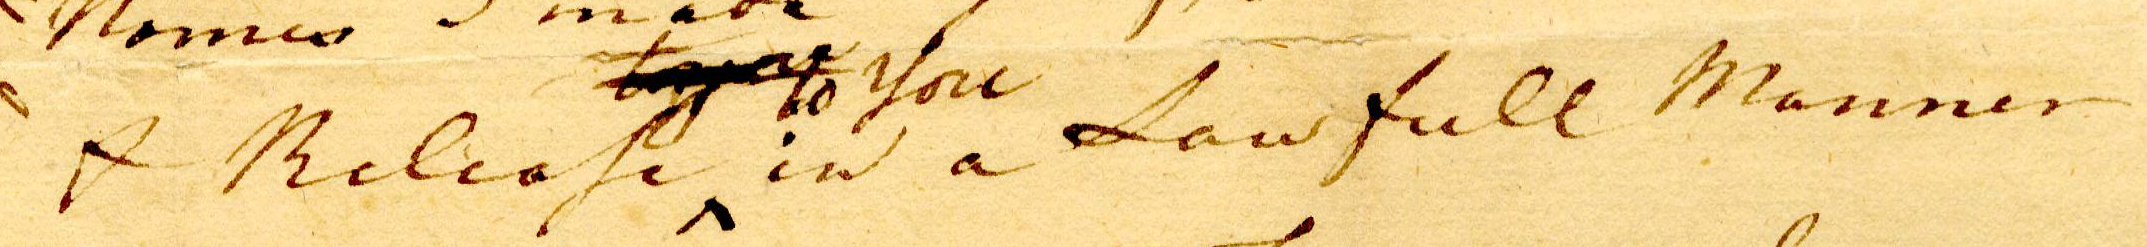& Release & in a Lawfull Manner
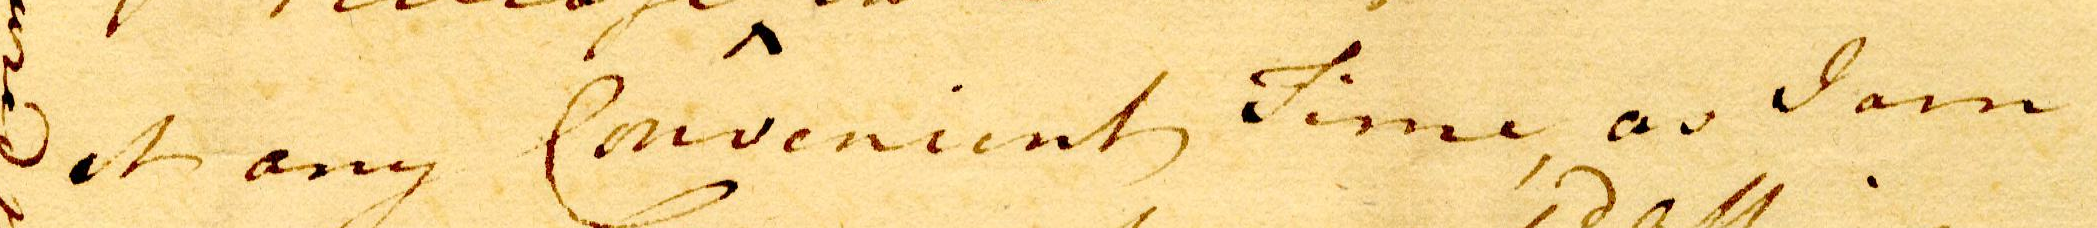at any Convenient Time, as I am
